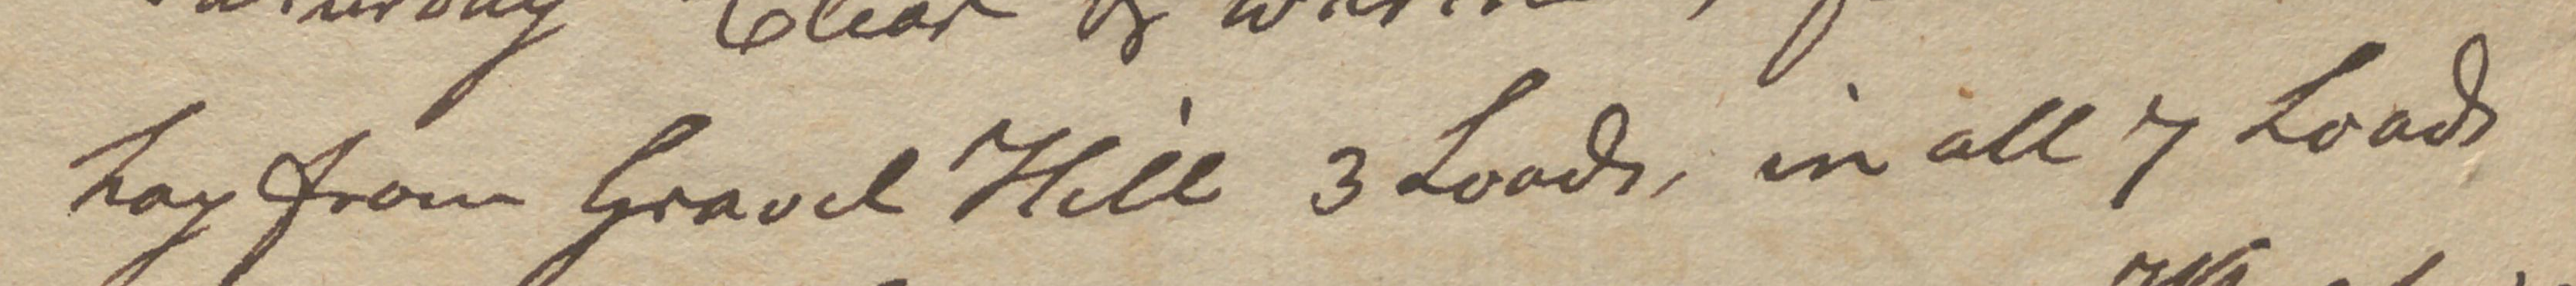hay from Gravel Hill 3 Loads, in all 7 Loads
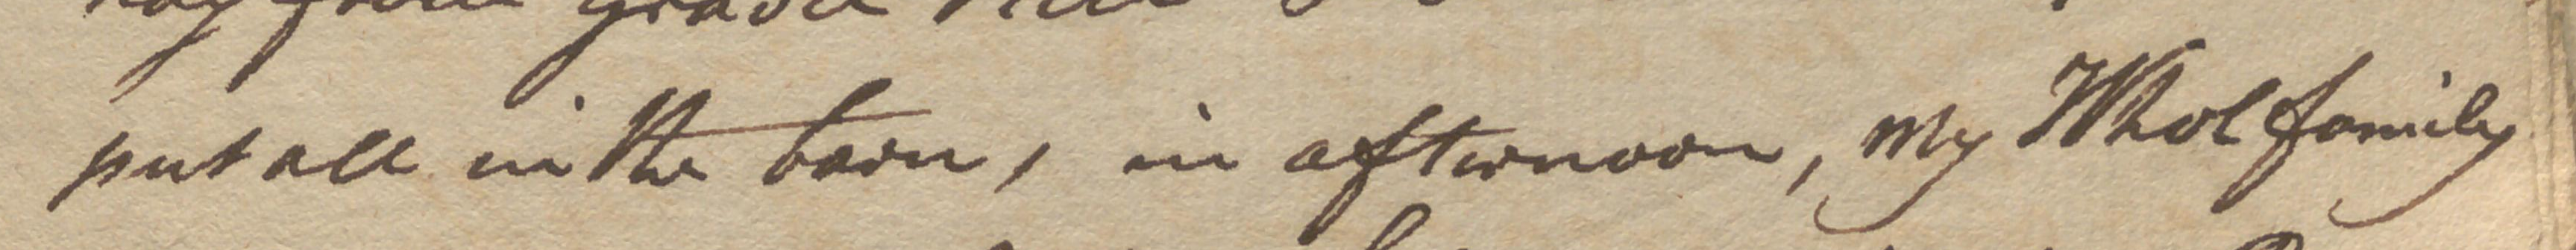put all in the barn, in afternoon, my Whol family
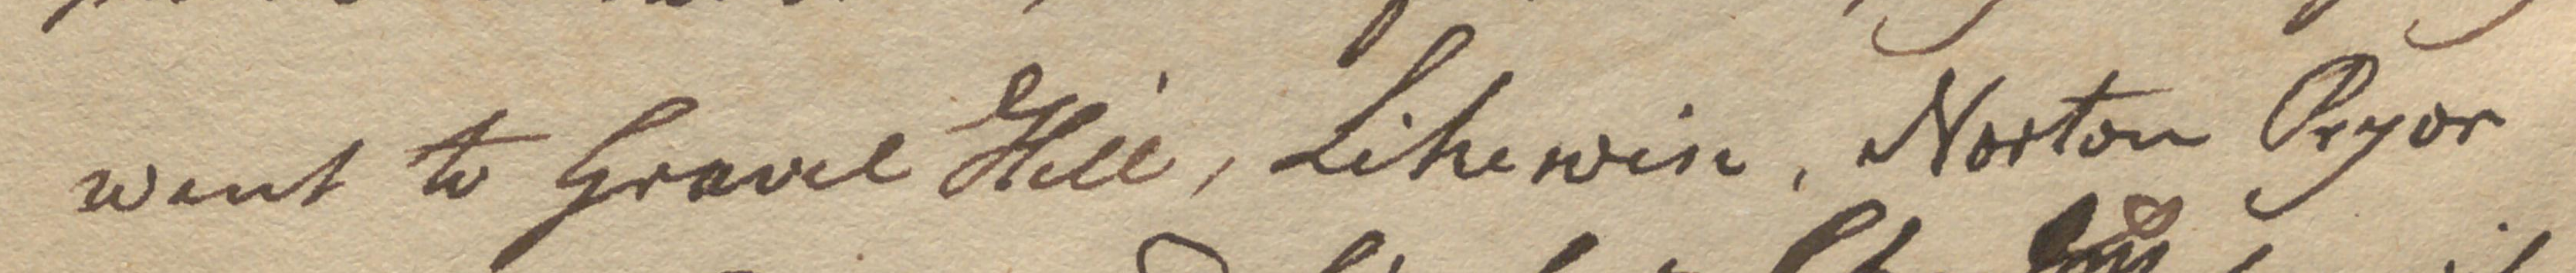went to Gravel Hill, Likewise, Norton Pryor
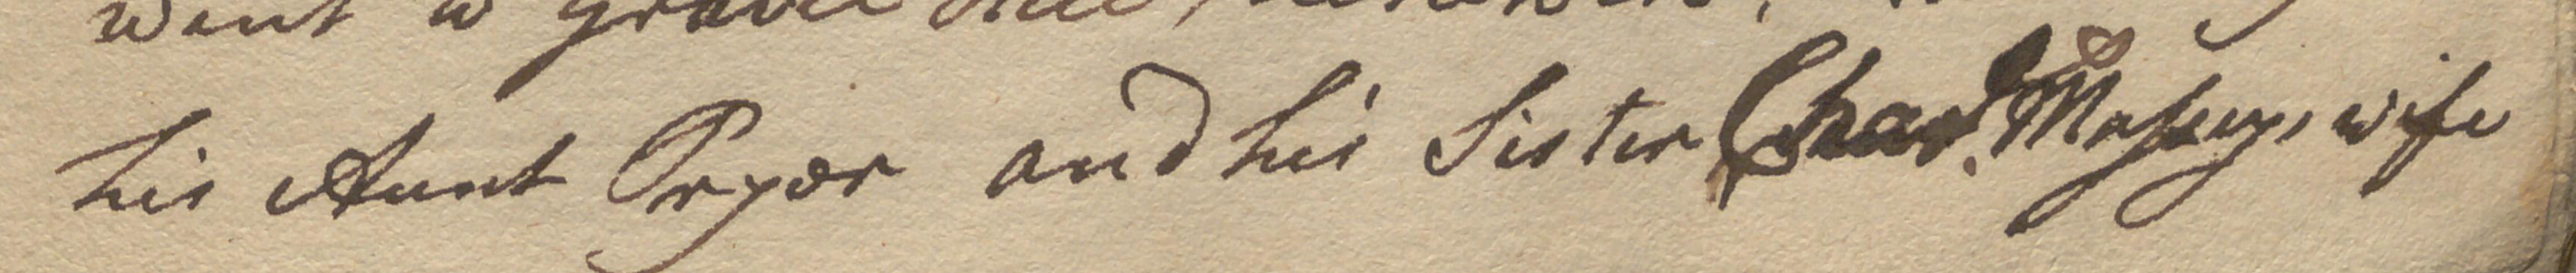his Aunt Pryor and his Sister Charl^s. Masseys wife
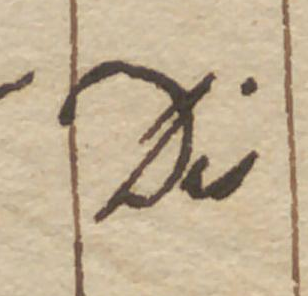Dis
